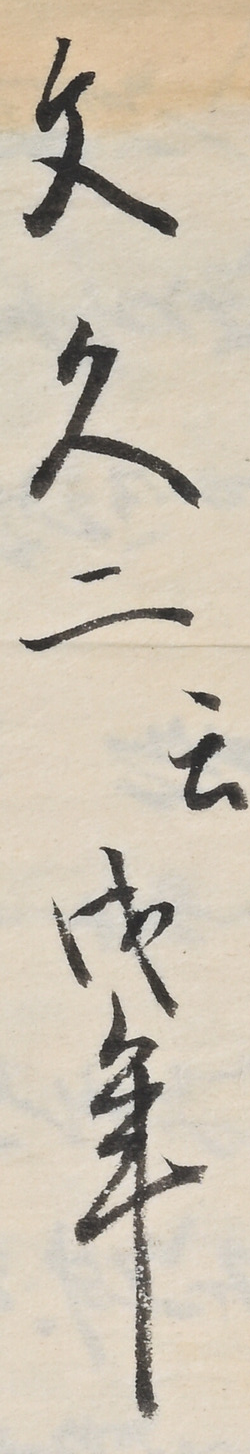㊞文久二壬戌年
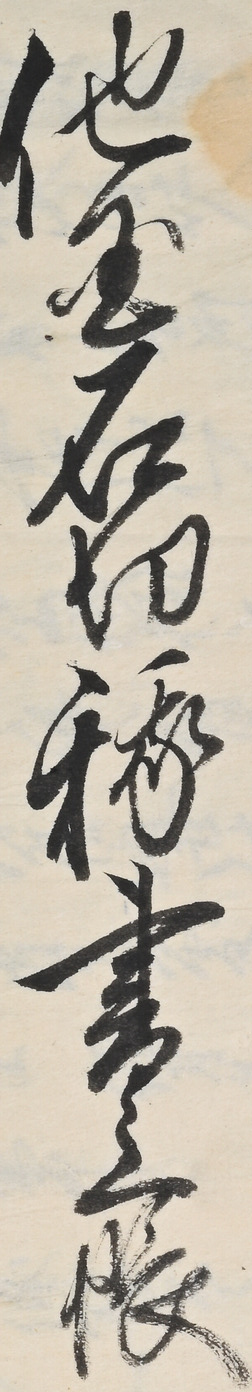他国石切稼書上帳
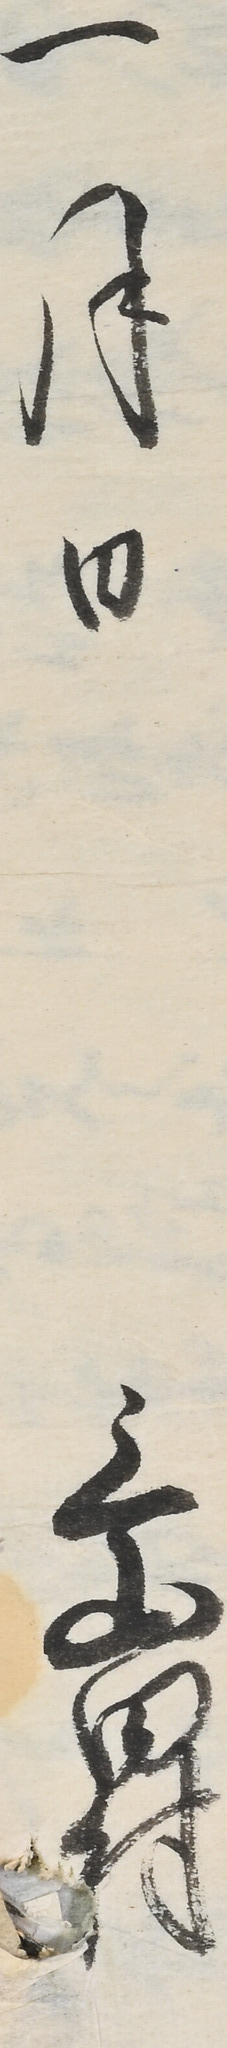㊞二月日上山田村

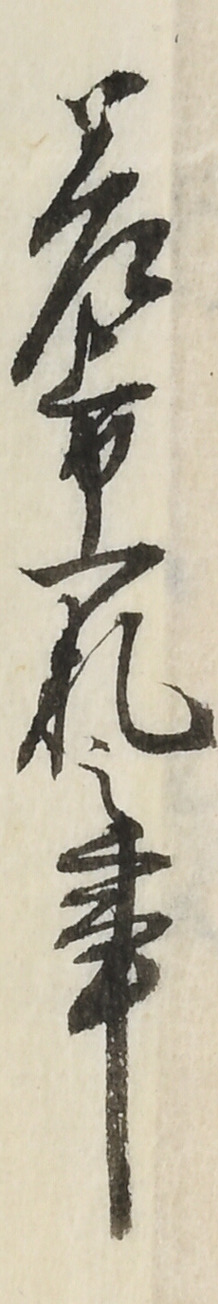差上申一札之事
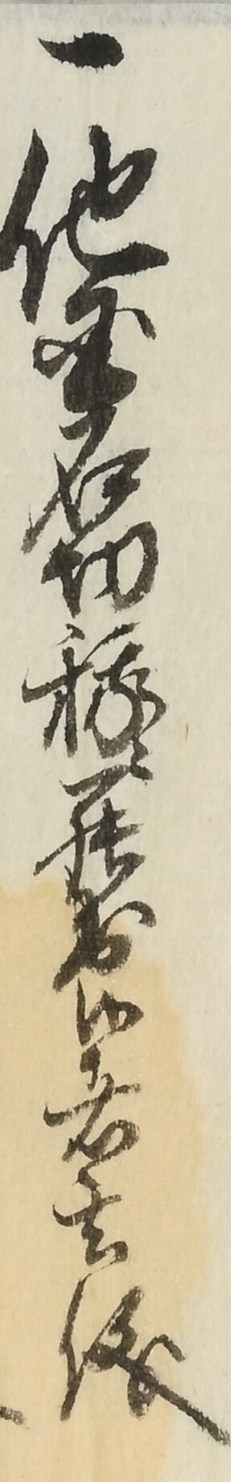一他国石切稼ニ罷出候者共儀
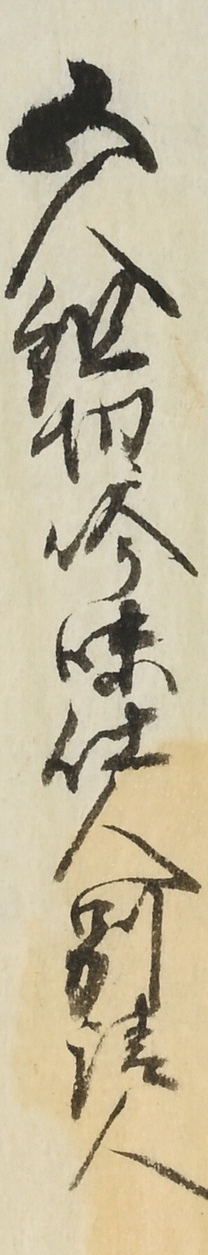五人組切吟味仕人別請人
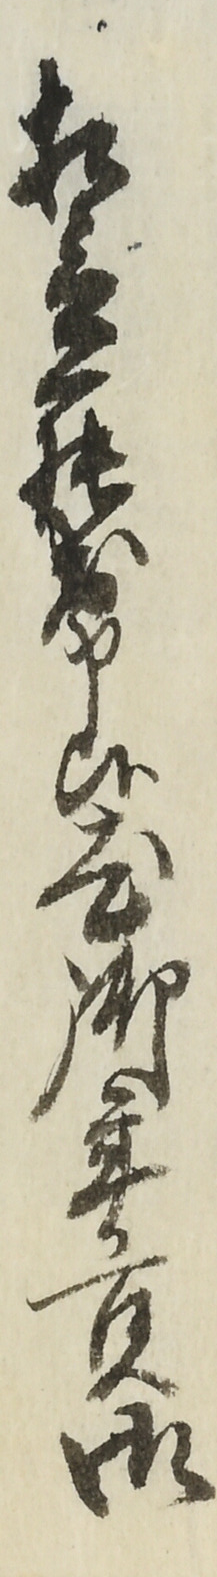相立罷出申候尤御年貢御
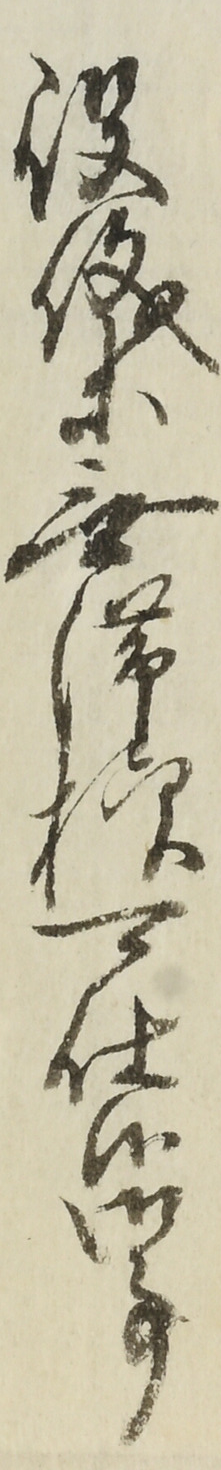役儀等無滞様可仕候御事
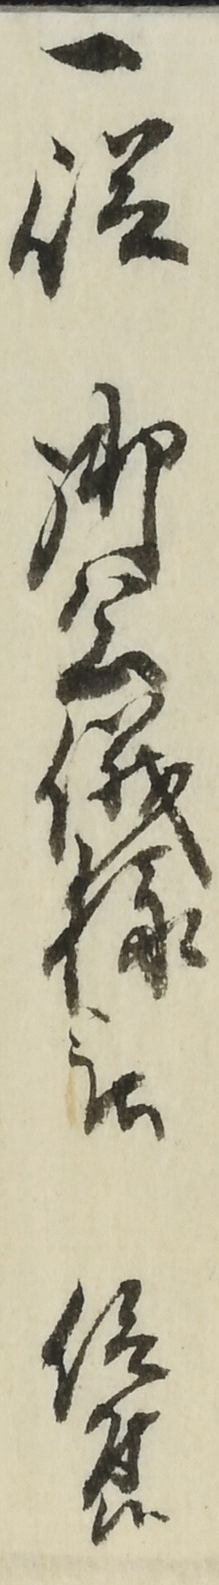一従御公儀様被仰付候

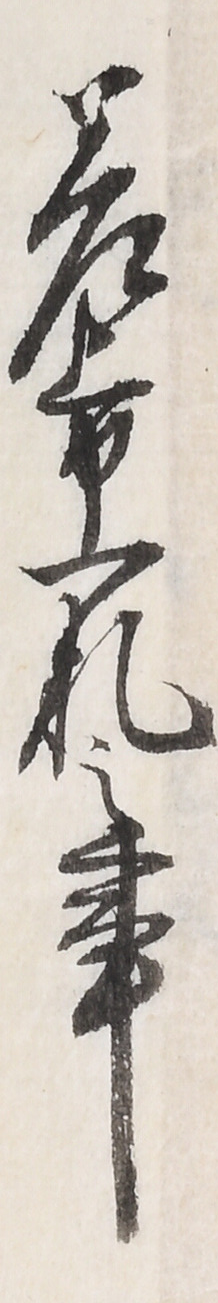差上申一札之事
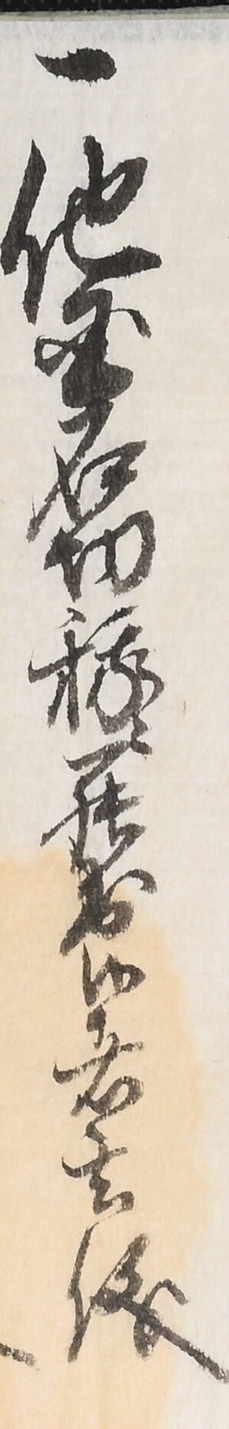一他国石切稼ニ罷出候者共儀
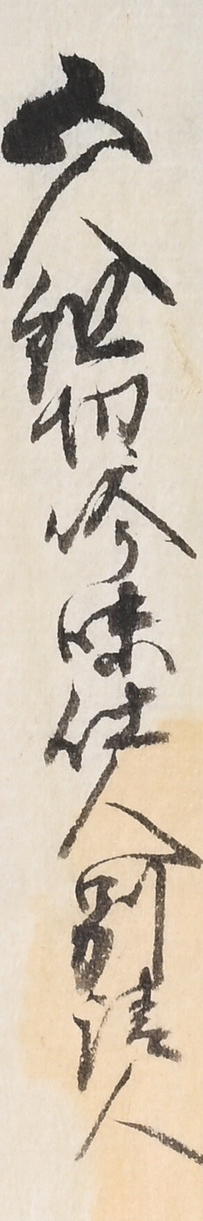五人組切吟味仕人別請人
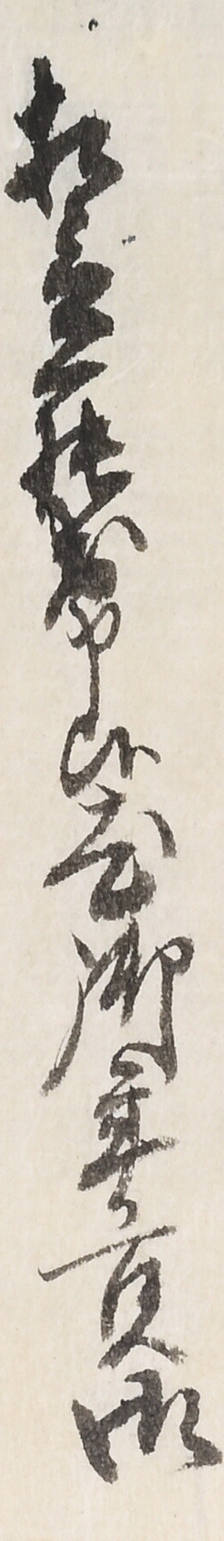相立罷出申候尤御年貢御
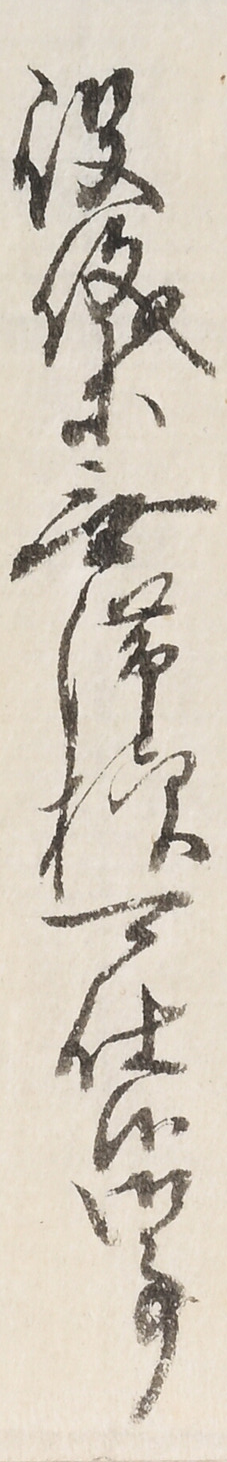役儀等無滞様可仕候御事
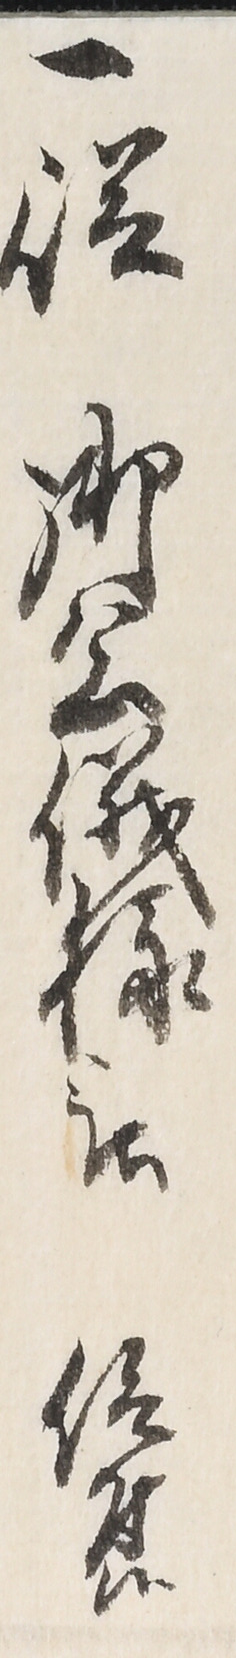一従御公儀様被仰付候
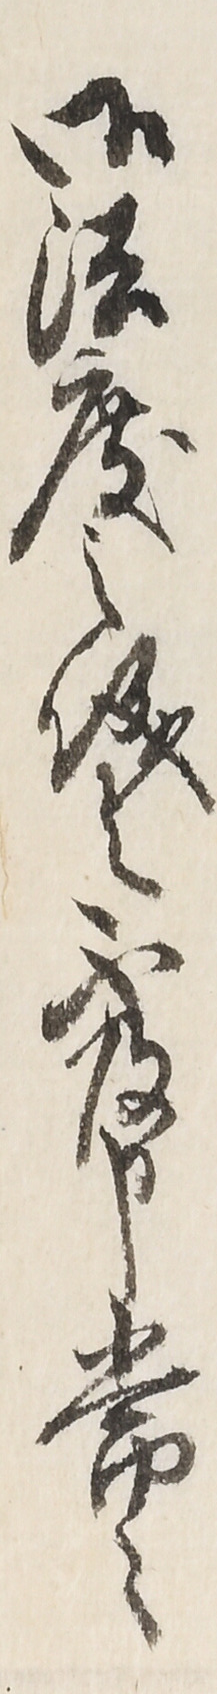御法度之儀は不及申常々
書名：文久二壬戌年二月日他国石切稼書上帳
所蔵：伊那市立高遠町図書館・合同会社AMANE
